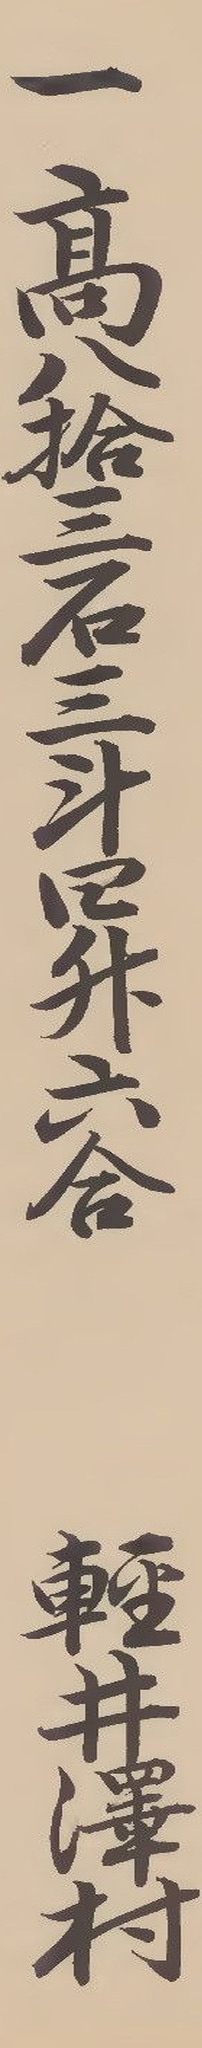一高八拾三石三斗四升六合軽井沢村
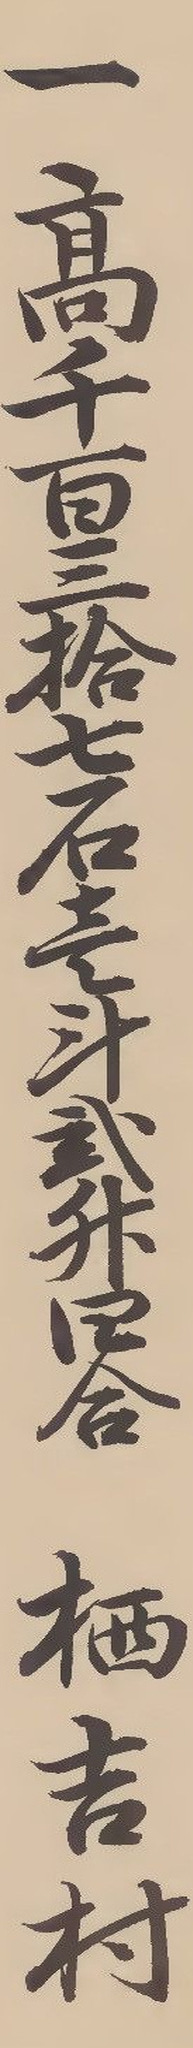一高千百三拾七石壱斗弐升四合栖吉村
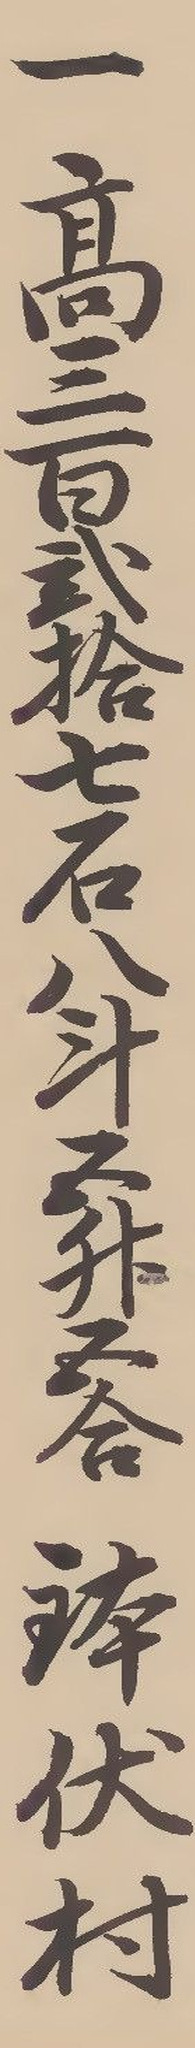一高三百弐拾七石八斗五升五合鉢伏村

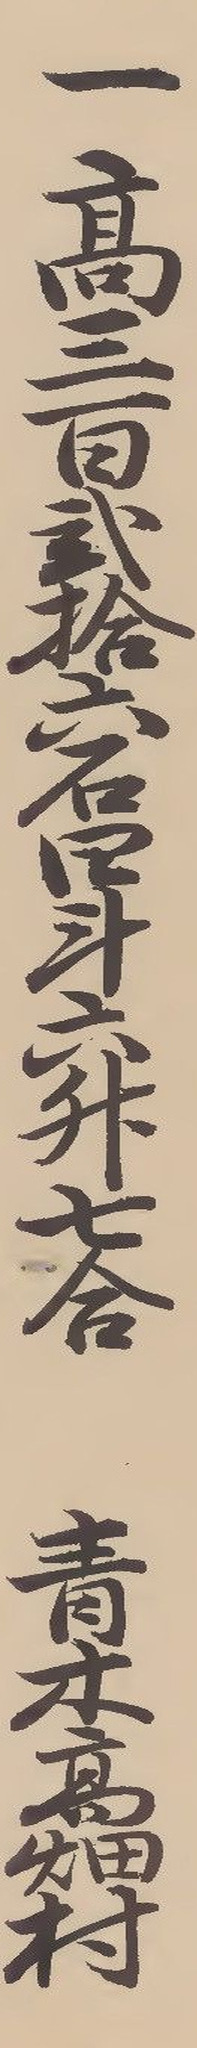一高三百弐拾六石四斗六升七合青木高畑村
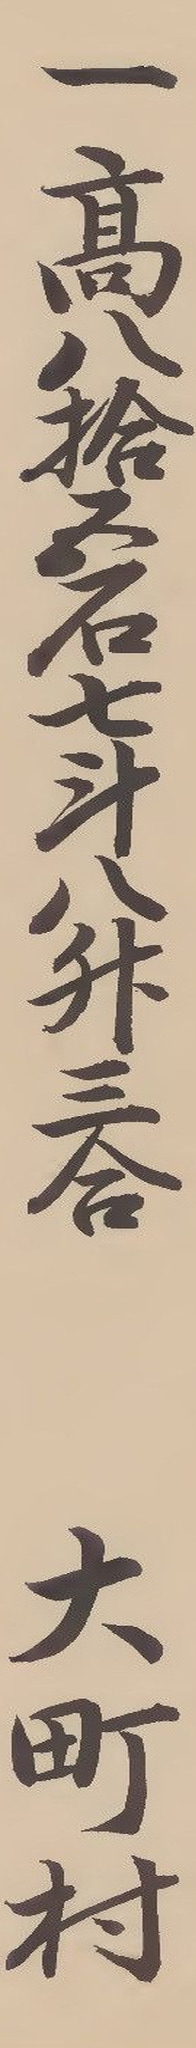一高八拾五石七斗八升三合大町村
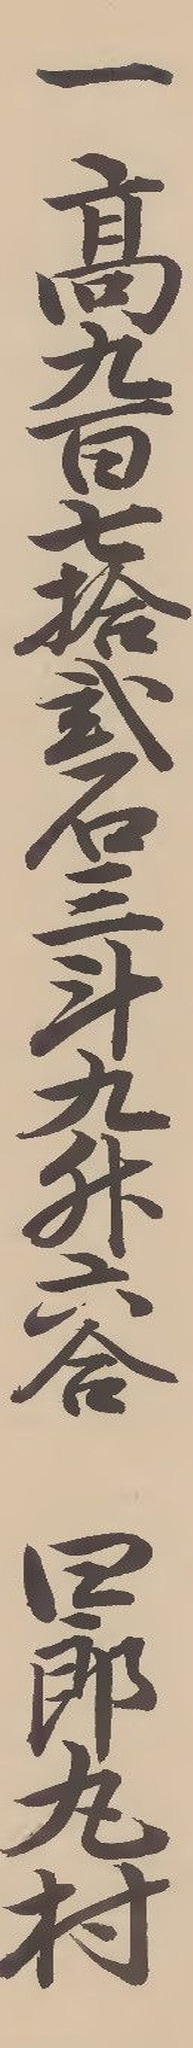一高九百七拾弐石三斗九升六合四郎丸村
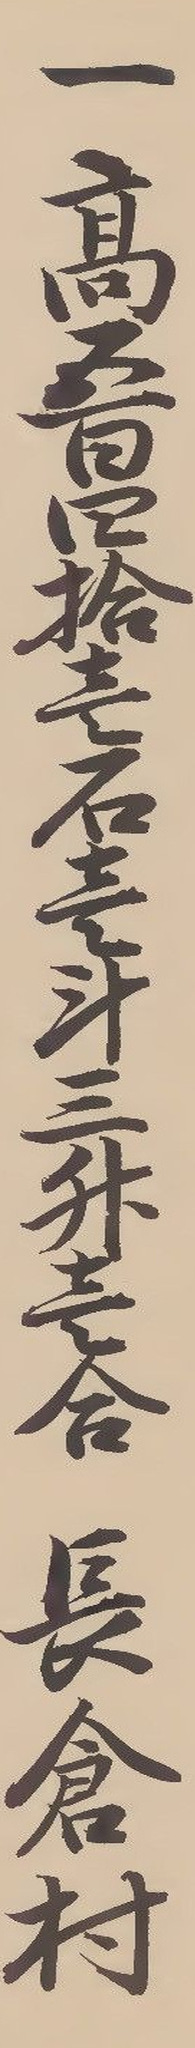一高五百四拾壱石壱斗三升壱合長倉村
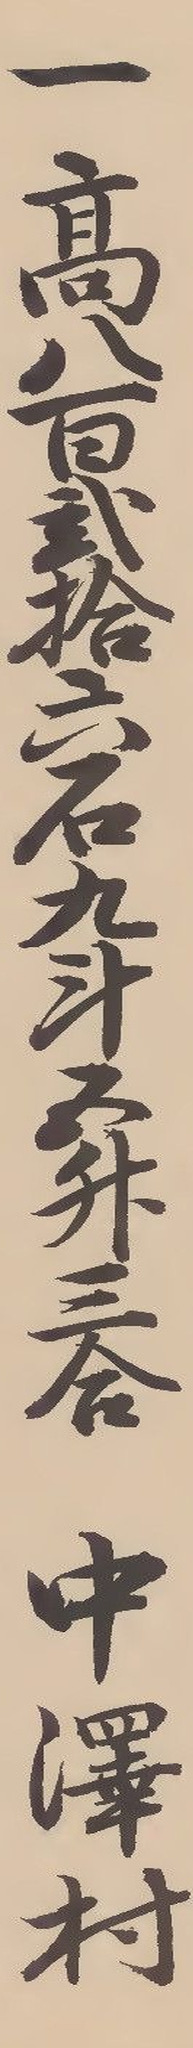一高八百弐拾六石九斗五升三合中沢村
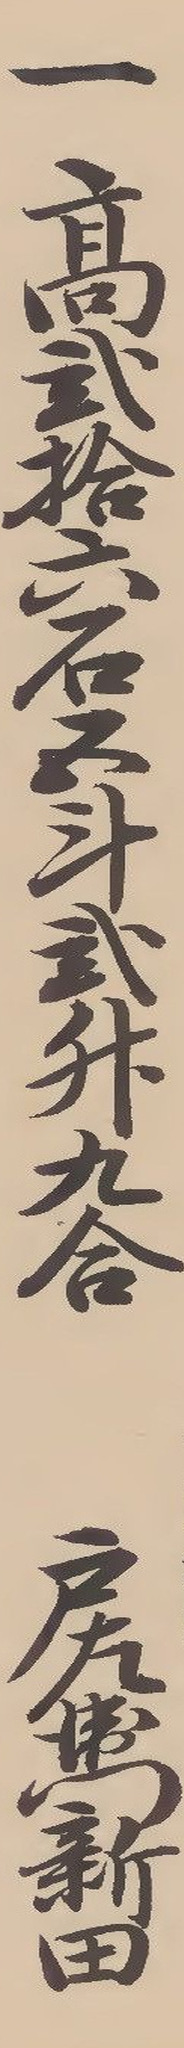一高弐拾六石五斗弐升九合戸左衛門新田
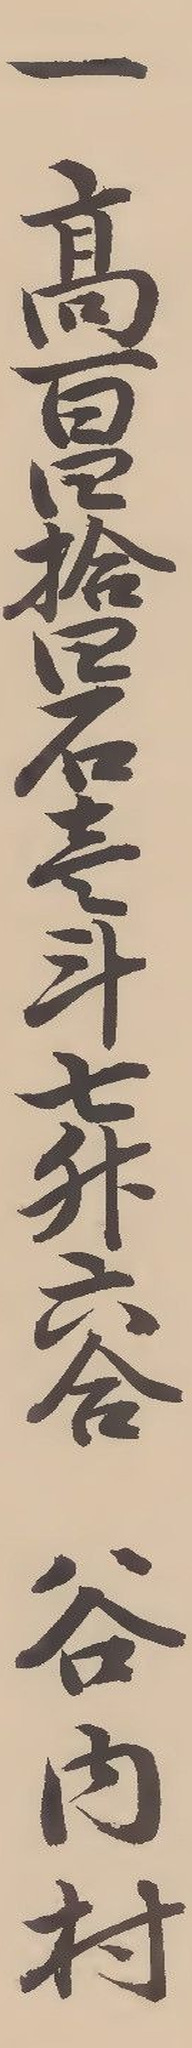一高百四拾四石壱斗七升六合谷内村
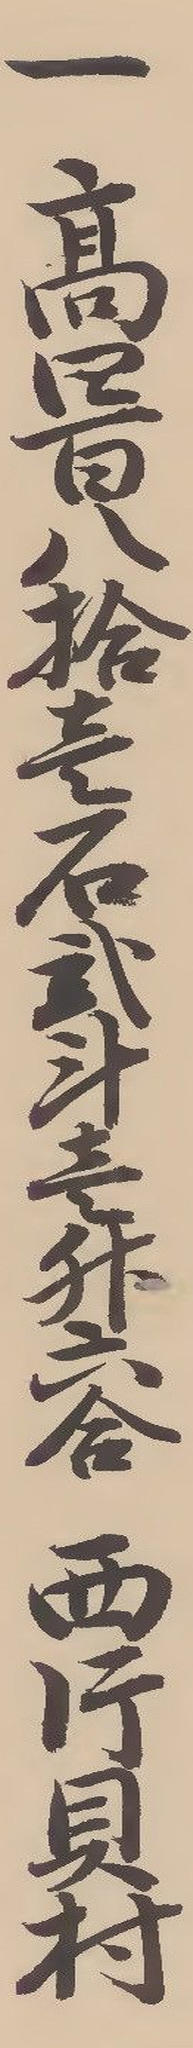一高四百八拾壱石弐斗壱升六合西片貝村

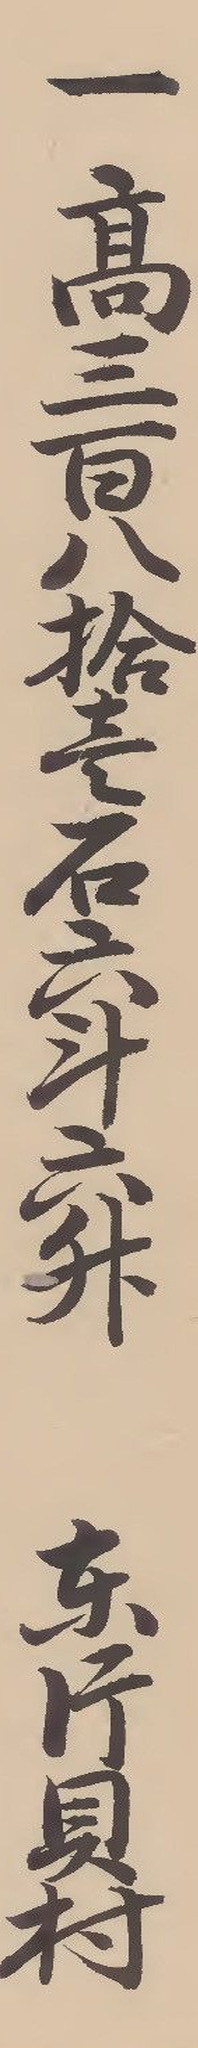一高三百八拾壱石六斗六升東片貝村
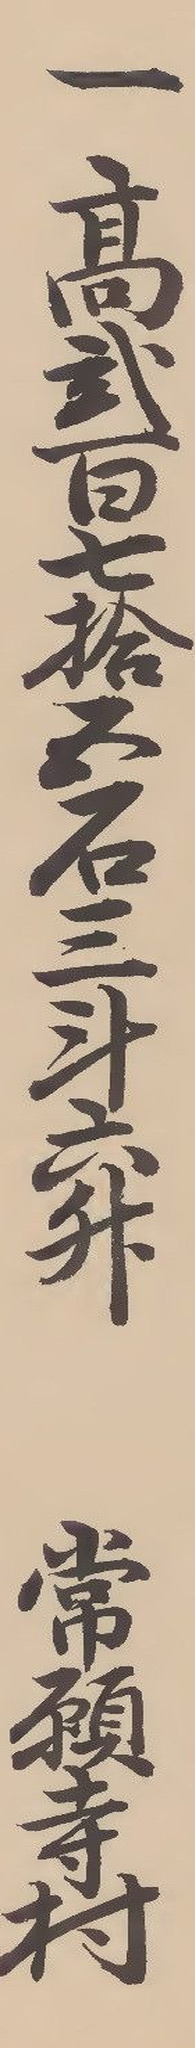一高弐百七拾五石三斗六升常願寺村
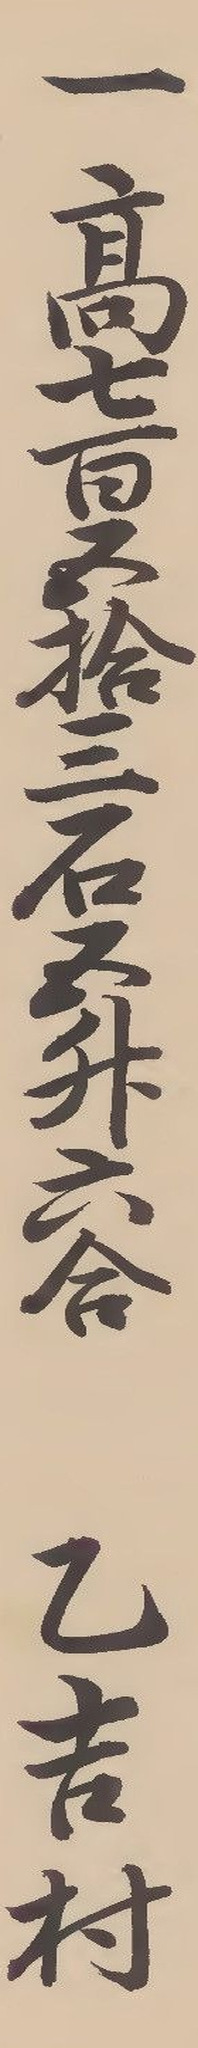一高七百五拾三石五升六合乙吉村
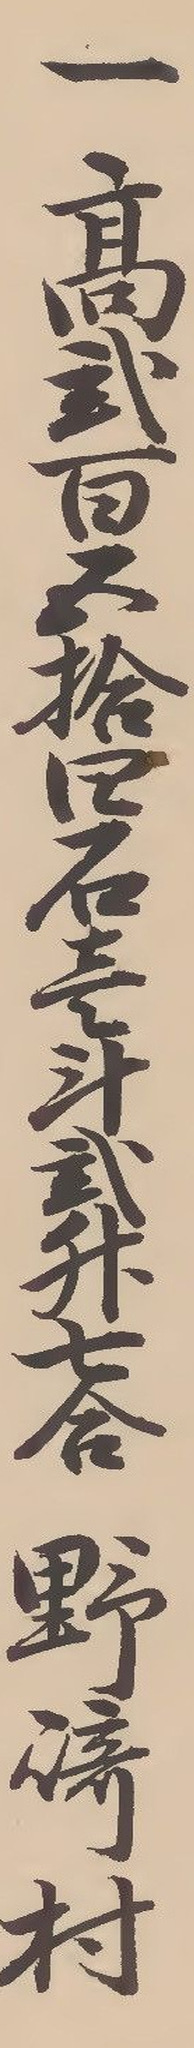一高弐百五拾四石壱斗弐升七合野崎村
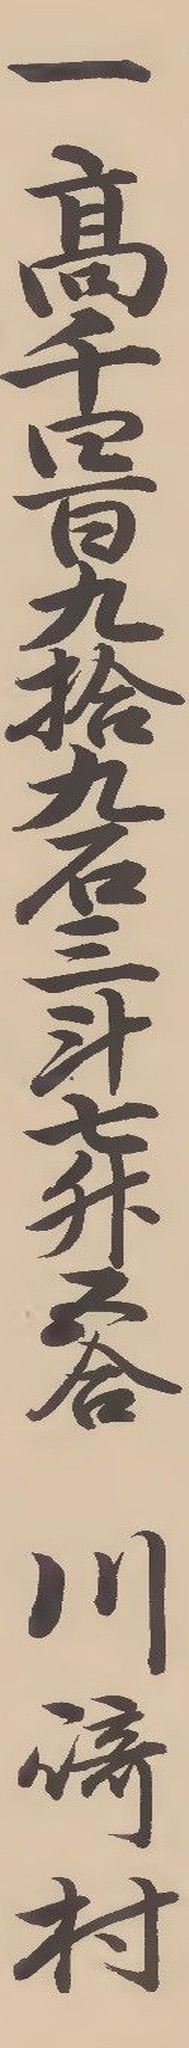一高千四百九拾九石三斗七升五合川崎村
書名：越後国郷帳　中
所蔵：国立公文書館 National Archives of Japan
